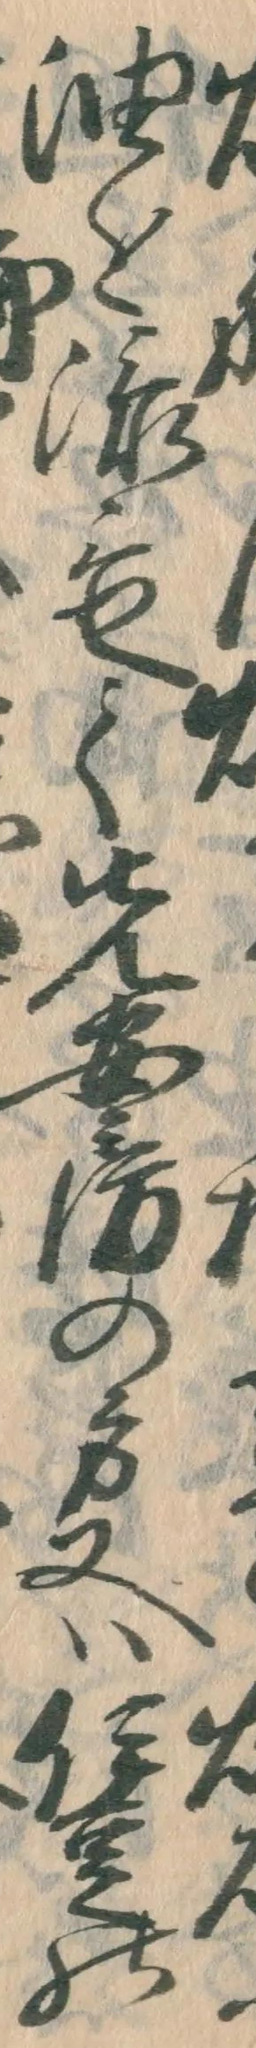油を流置て先安房の方又ハ伊豆の
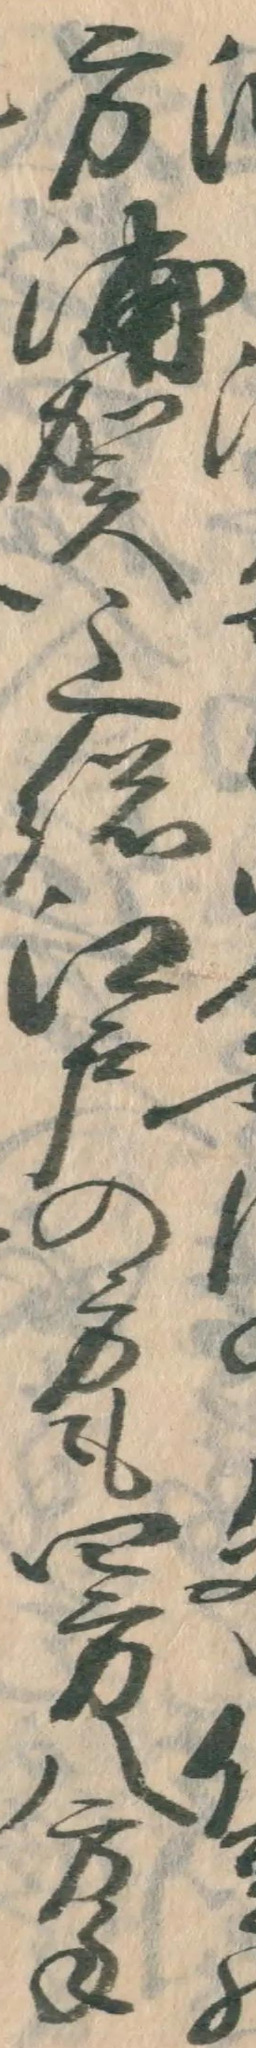方浦賀上総江戸の方も四方八方手
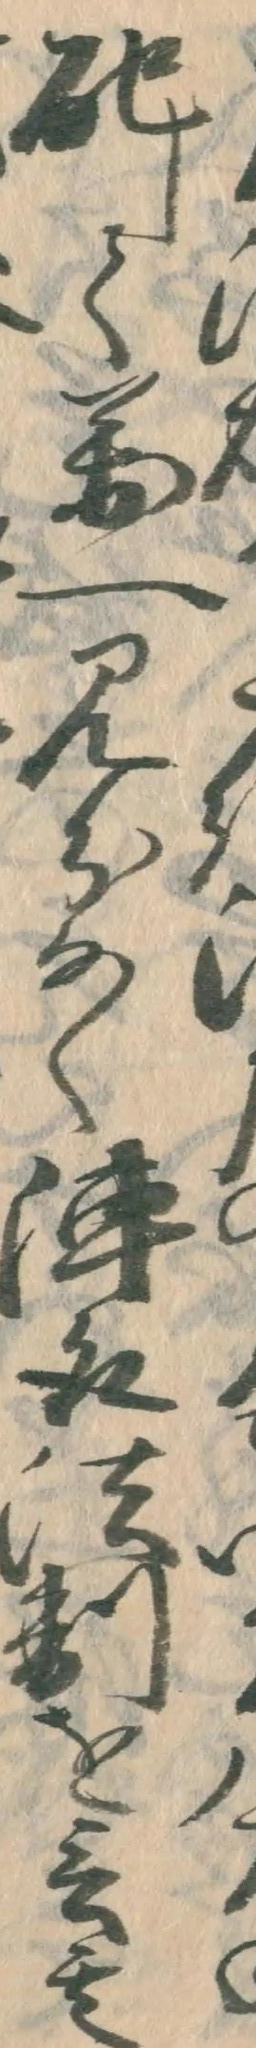配して萬一見分なく陣取法制を言其
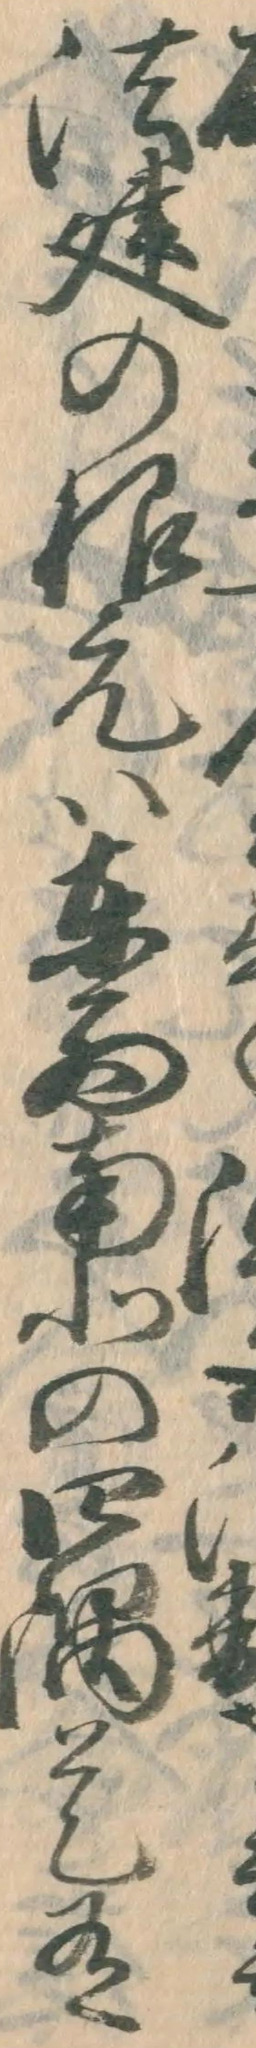法建の根元ハ東西南北の四隅是有

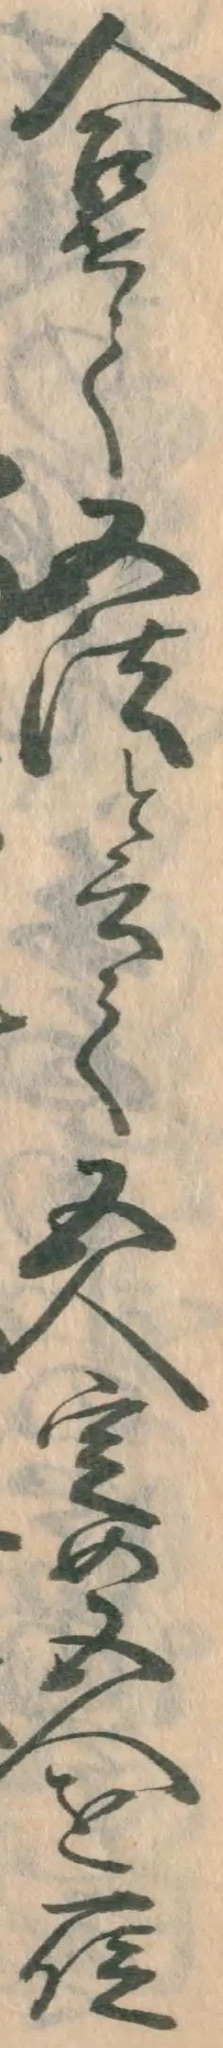合せて五法と云て五人定め五人を一位
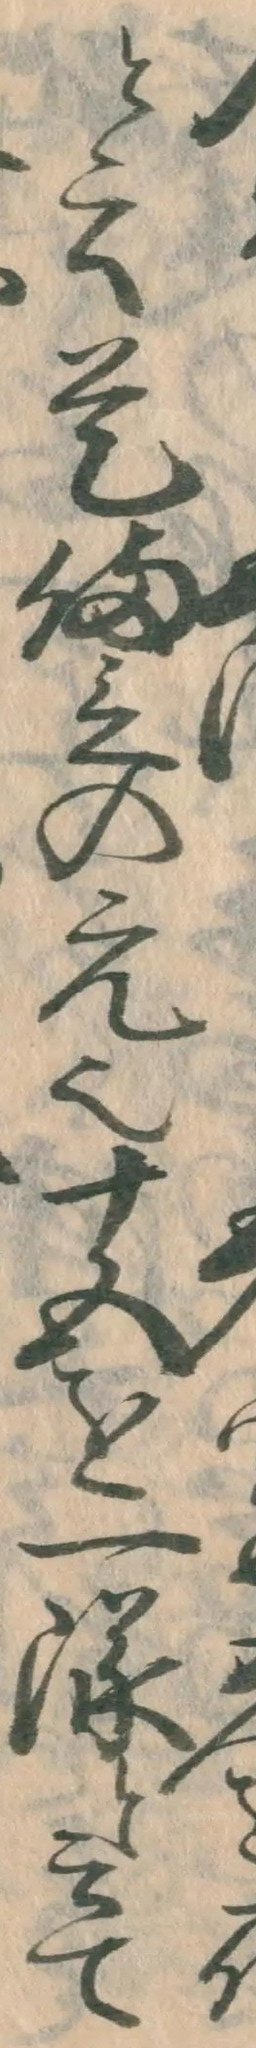と云是備立の元也十五を一隊と云て
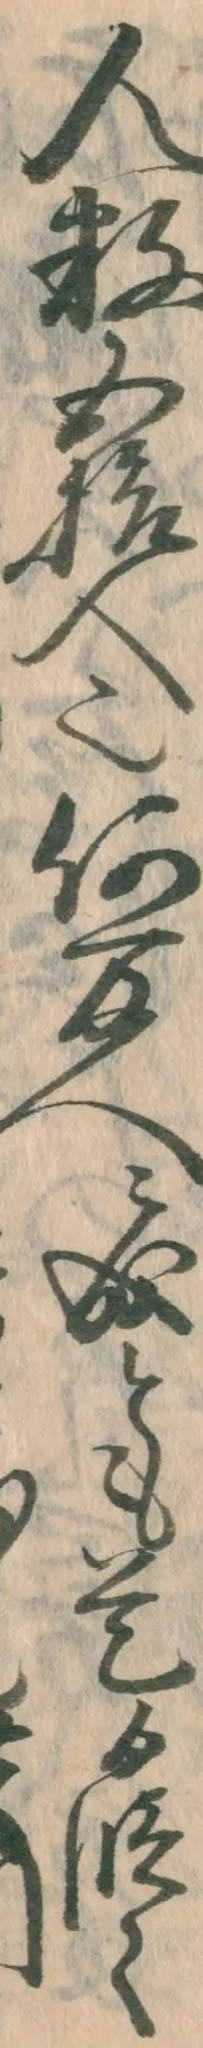人数五拾人也何万人ニ成とも是ゟ段々
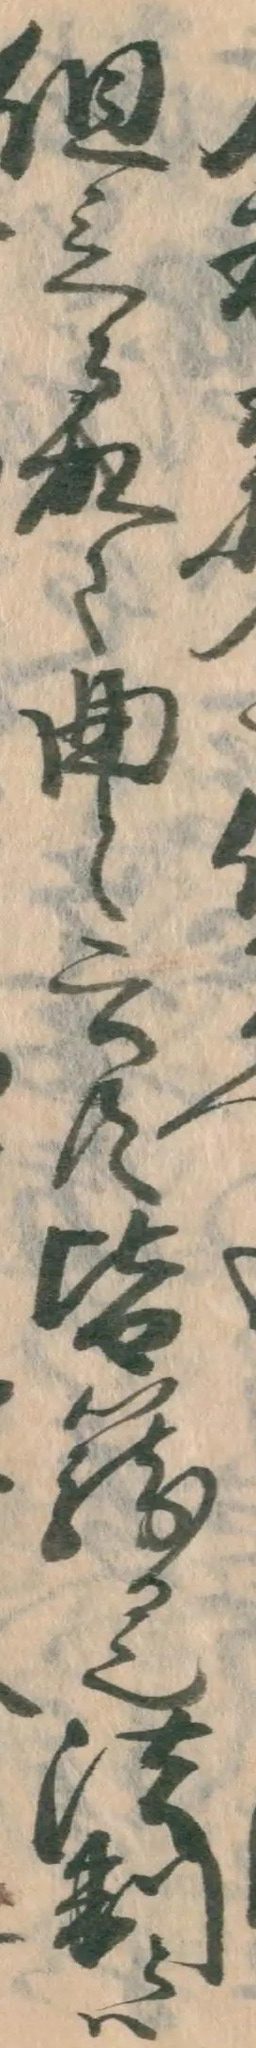組立る故に曲と云共皆籠る也法制とハ
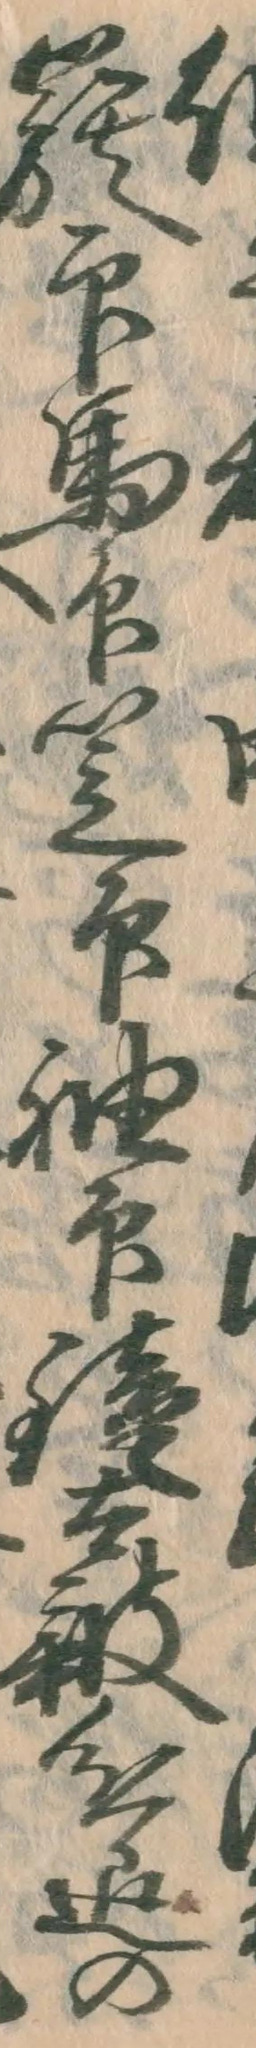籏印馬印笠印袖印鐘太鼓進退の
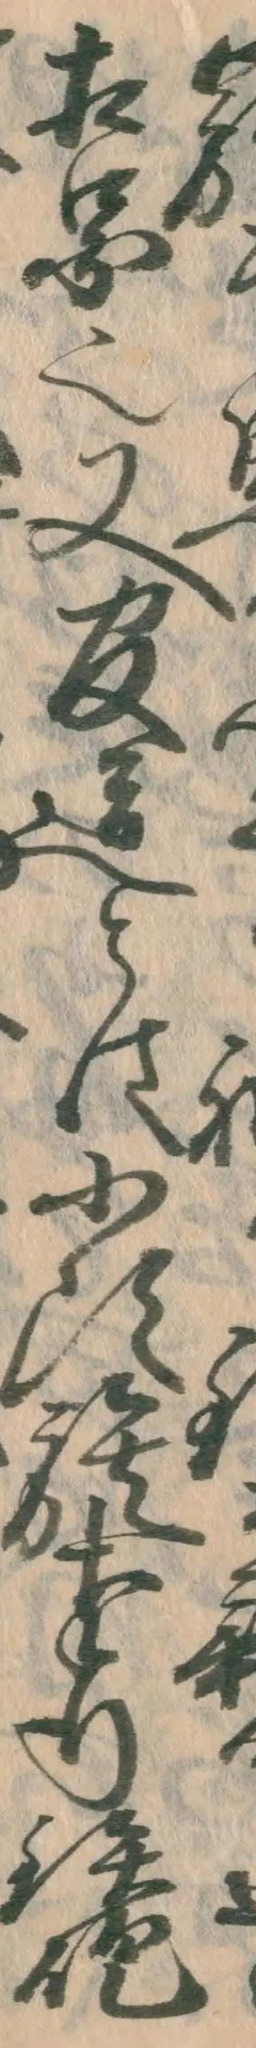相図也又官道とは小頭籏奉行鉄砲
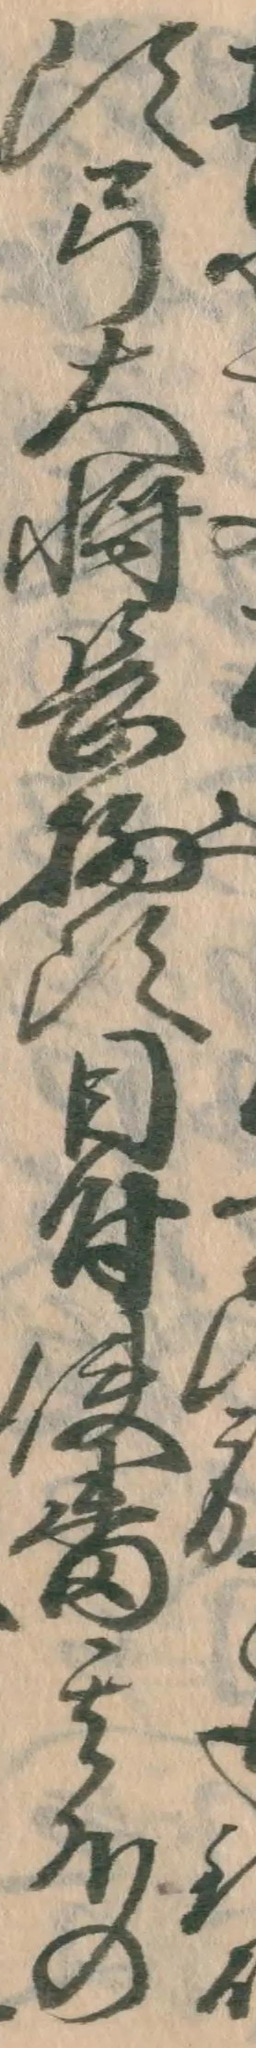頭弓大将長柄頭目付使番其外の
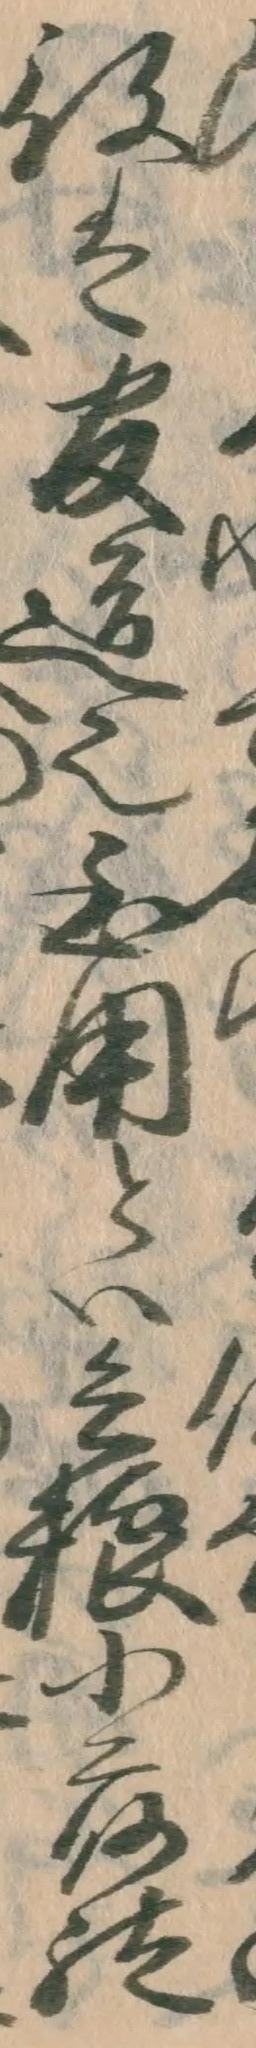役は官道也至用とハ兵粮小荷駄
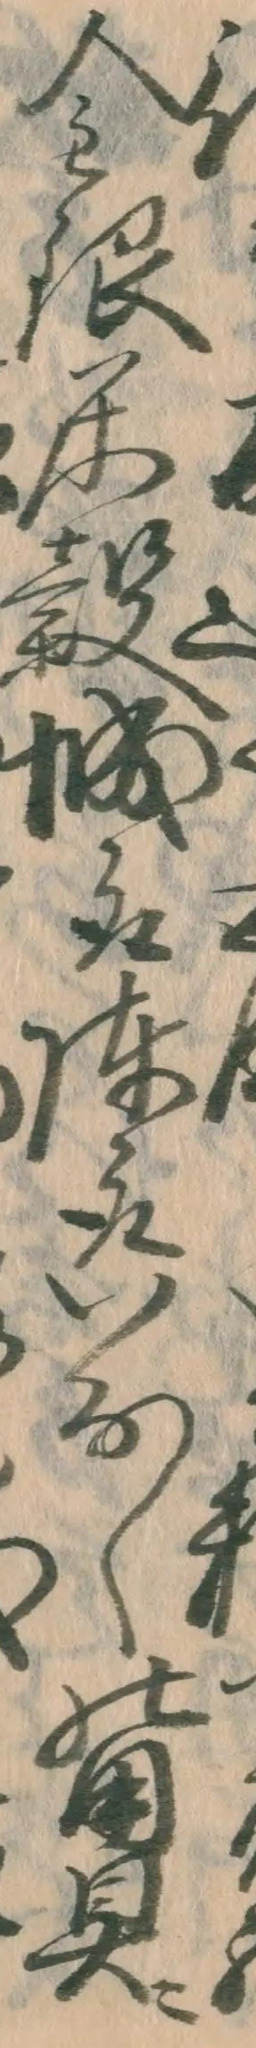金銀米穀城取陣取いろ〳〵の用具ニ
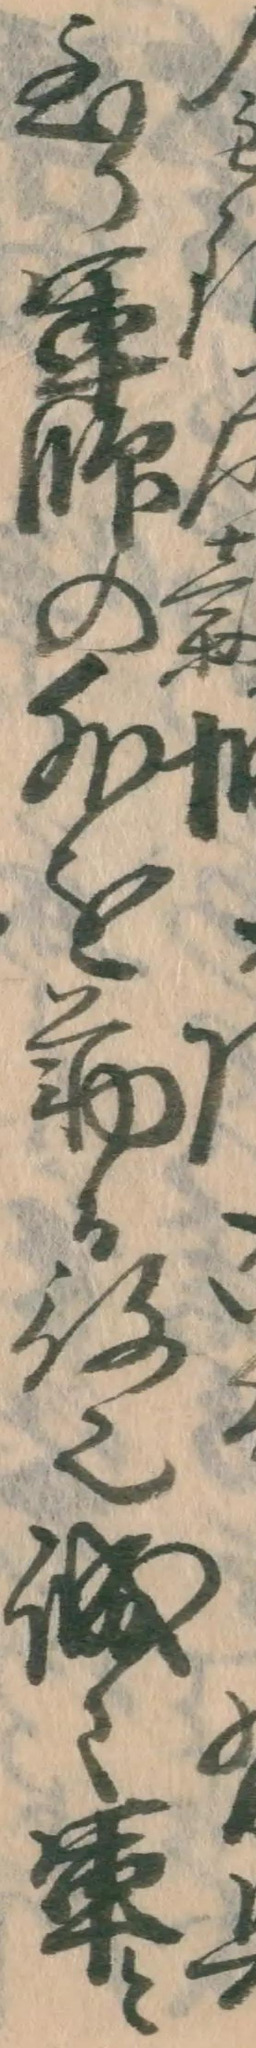至り軍師の外を勤る役也誠に軍と
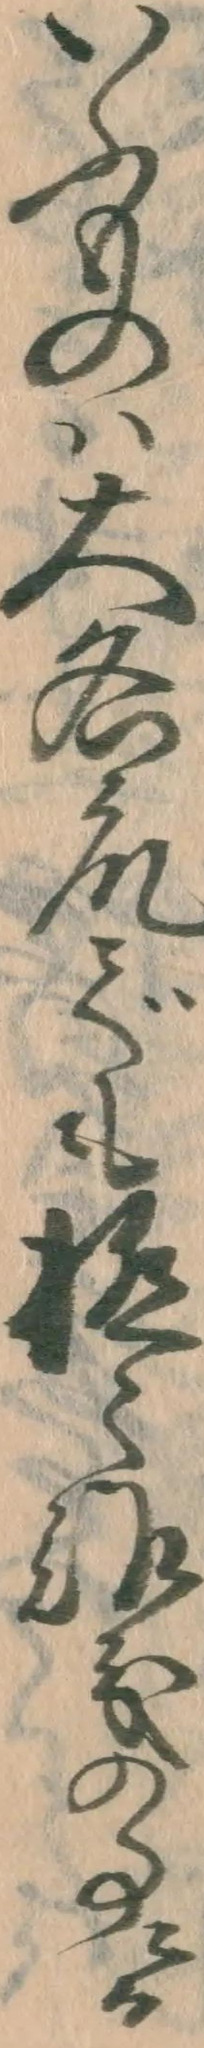いふものハ大名衆でも極て難義の事二而
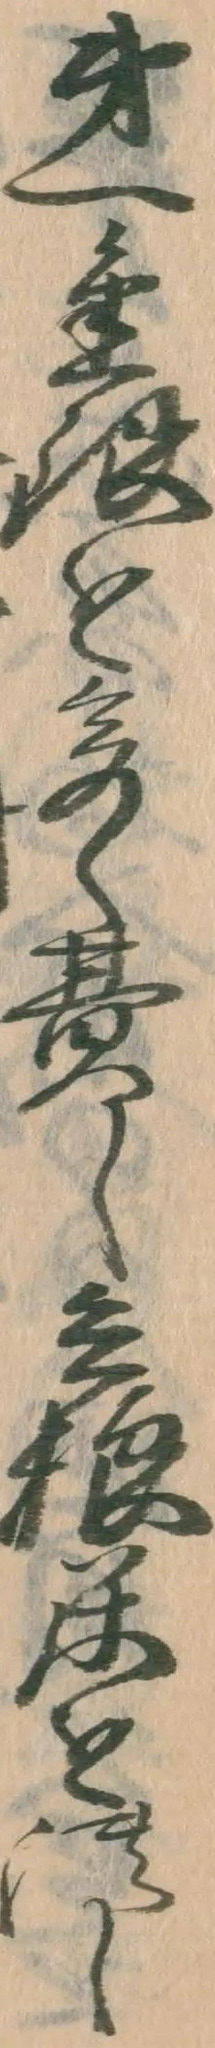第一金銀を多く費し兵粮米を潰し
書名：麗斎叢書. 20
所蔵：国立国会図書館 National Diet Library, JAPAN
